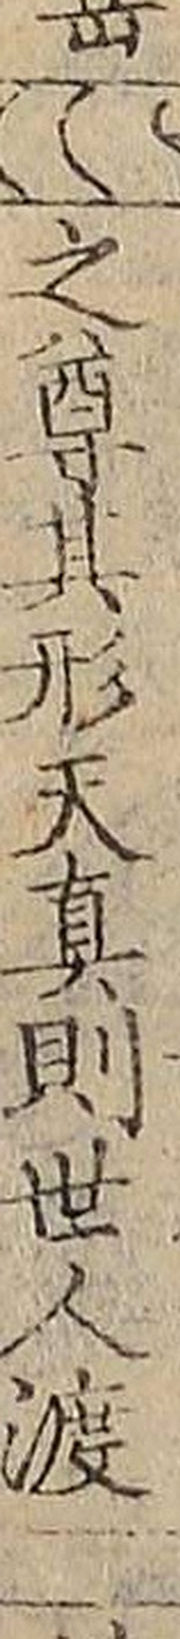之尊其形天真則世人渡
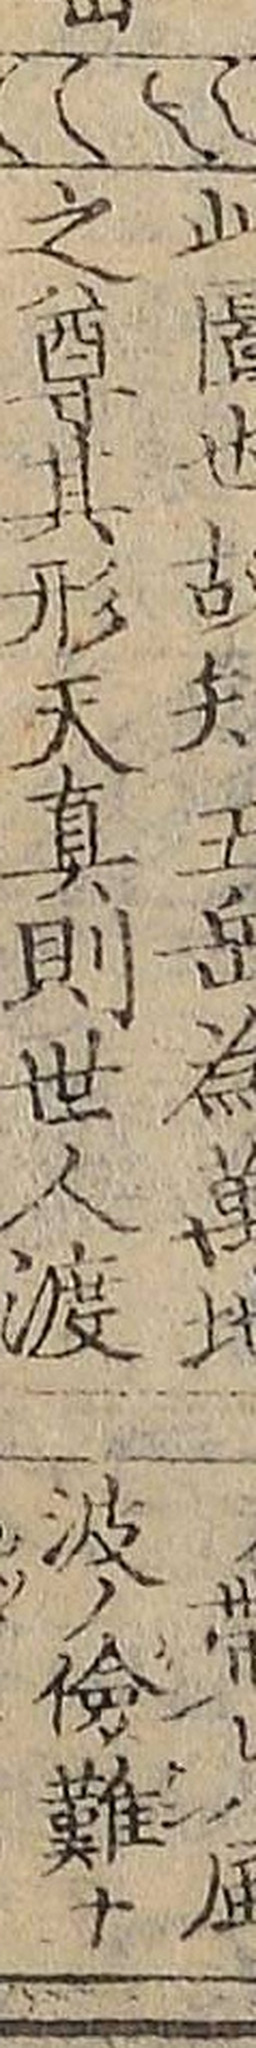之尊其形天真則世人渡
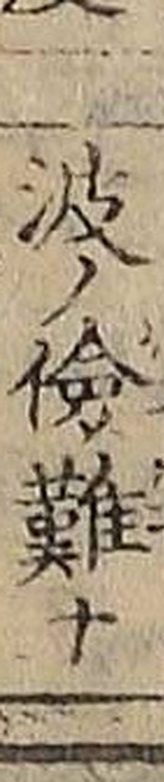波ノ倹難ナ
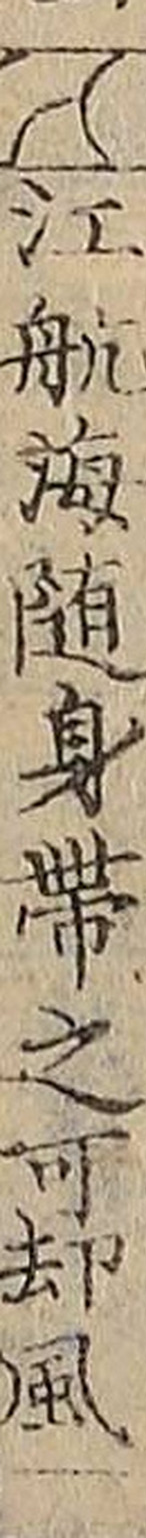江航海随身帯之可却風
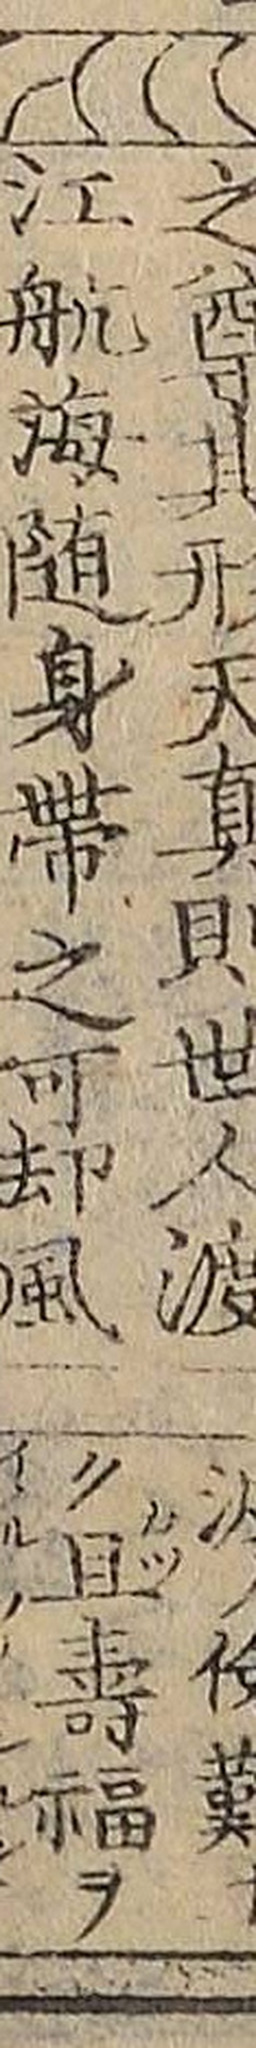江航海随身帯之可却風
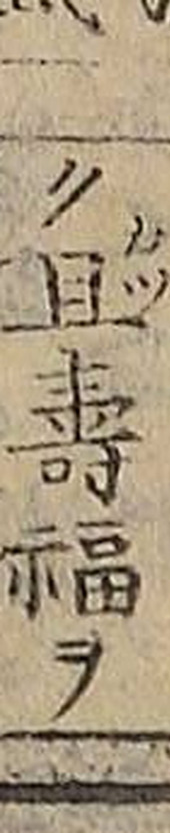ク且寿福ヲ
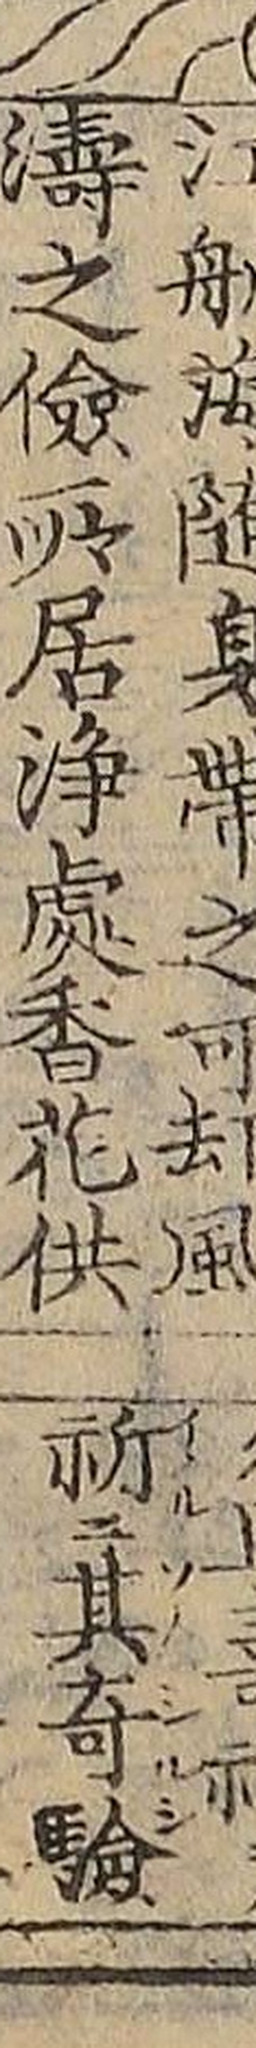濤之倹所居浄処香花供
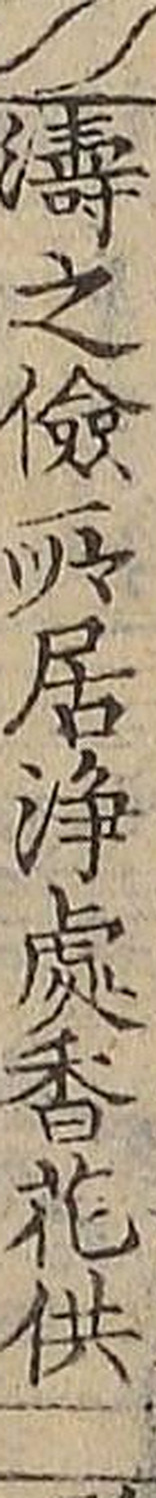濤之倹所居浄処香花供
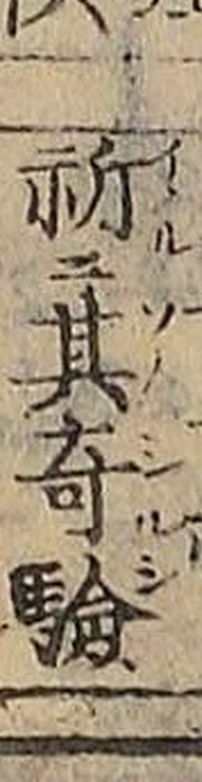祈ニ其奇験
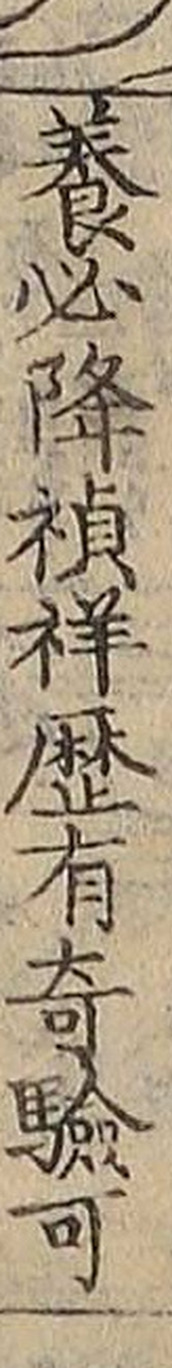養必降禎祥歴有奇験可
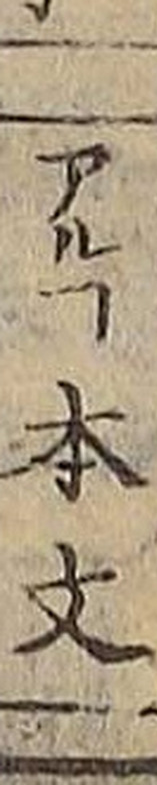アルヿ本文
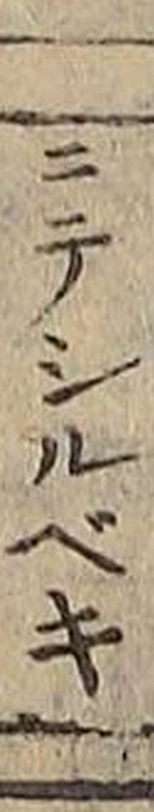ニテシルベキ
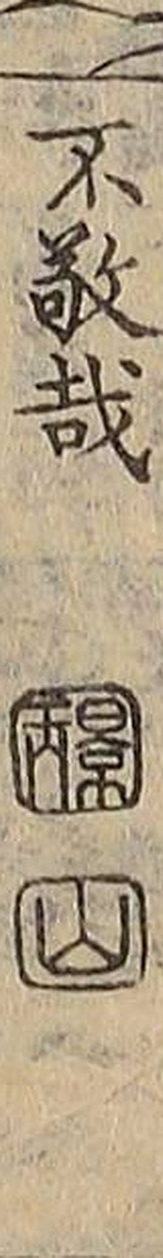不敬哉
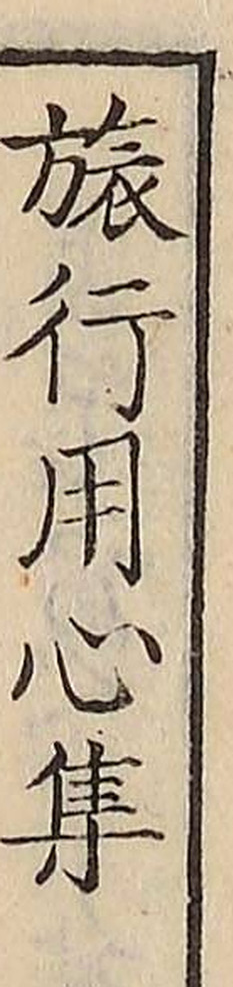旅行用心集
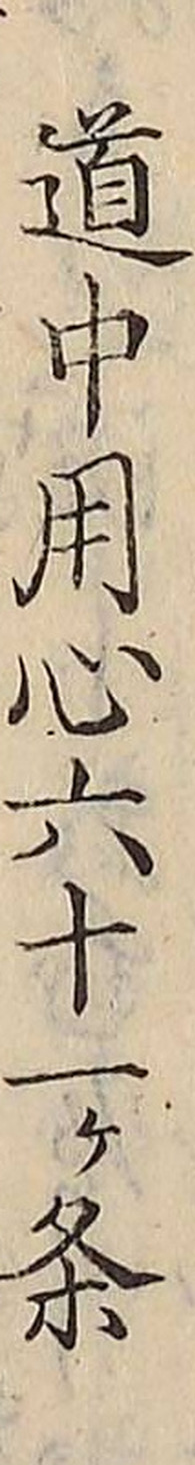道中用心六十一ケ条
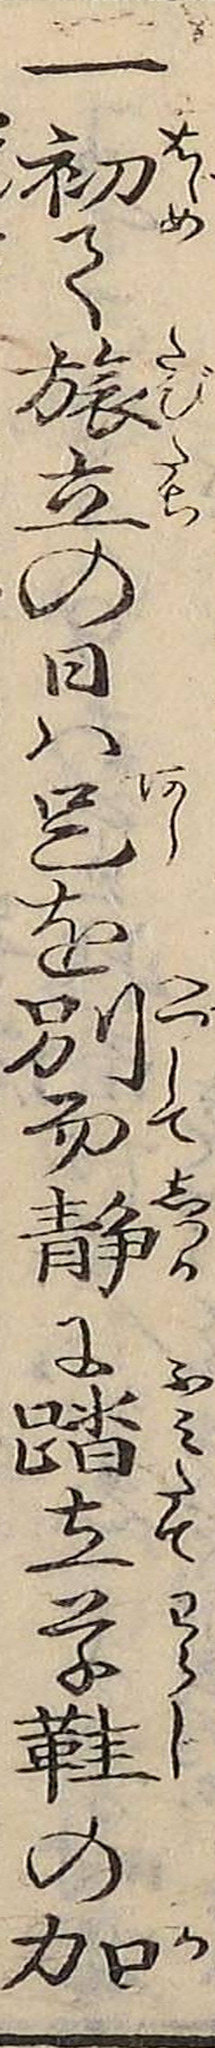一初て旅立の日は足を別而静に踏立草鞋の加
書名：旅行用心集
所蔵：神戸大学附属図書館 国文学研究資料館
